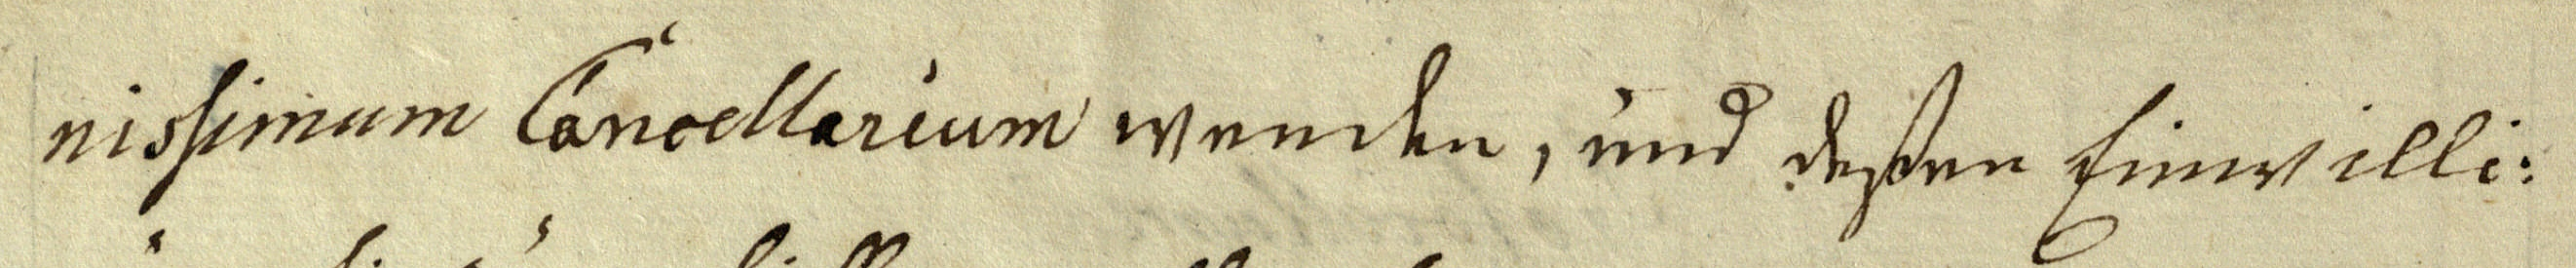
nissimum Cancellarium wenden, und dessen Einwilli¬
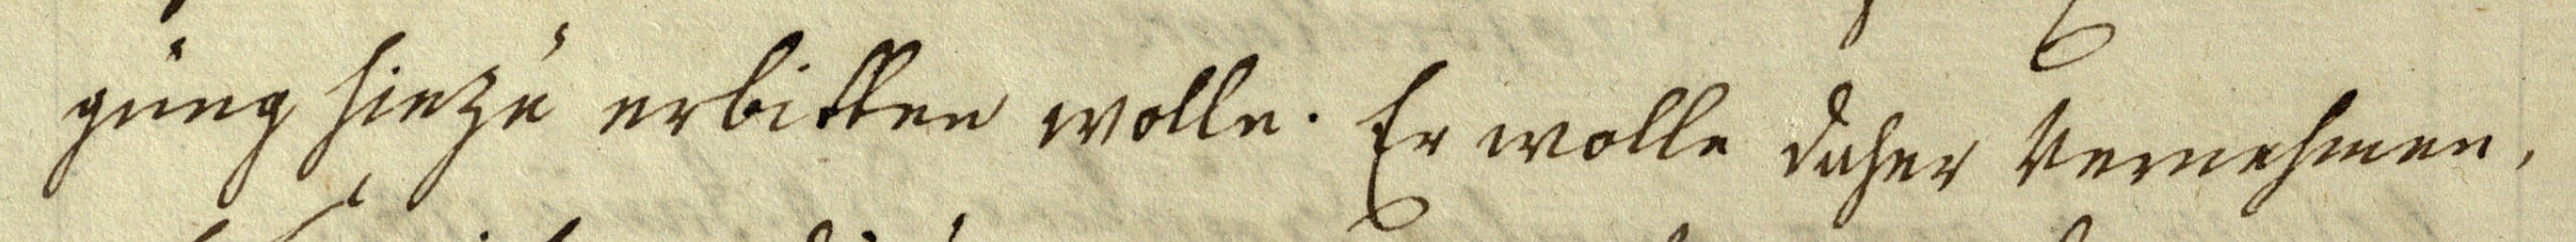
gung hiezu erbitten wolle. Er wolle daher vernehmen,
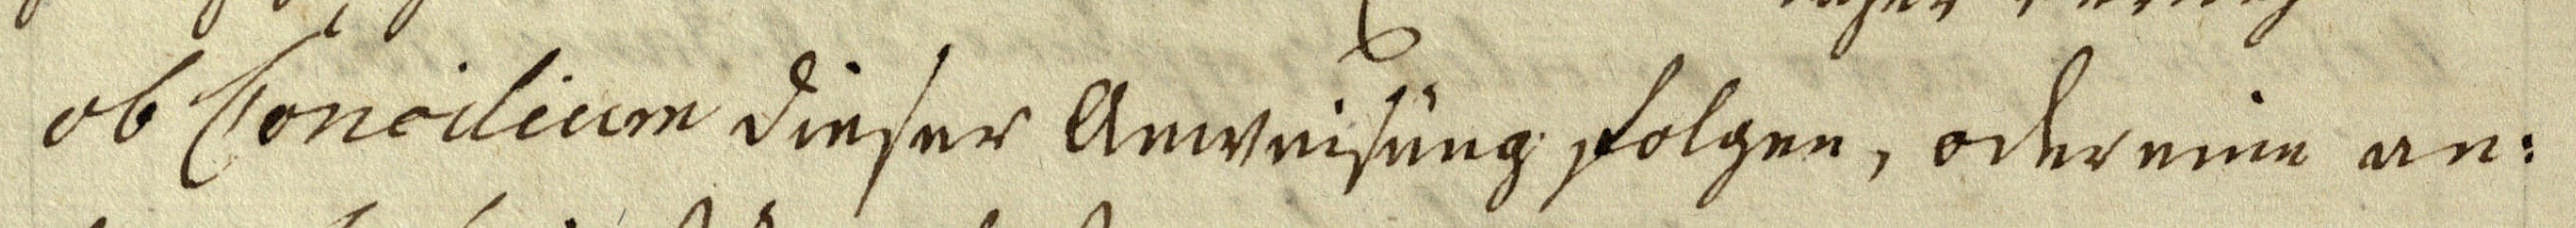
ob Concilium dieser Anweisung folgen, oder eine an¬
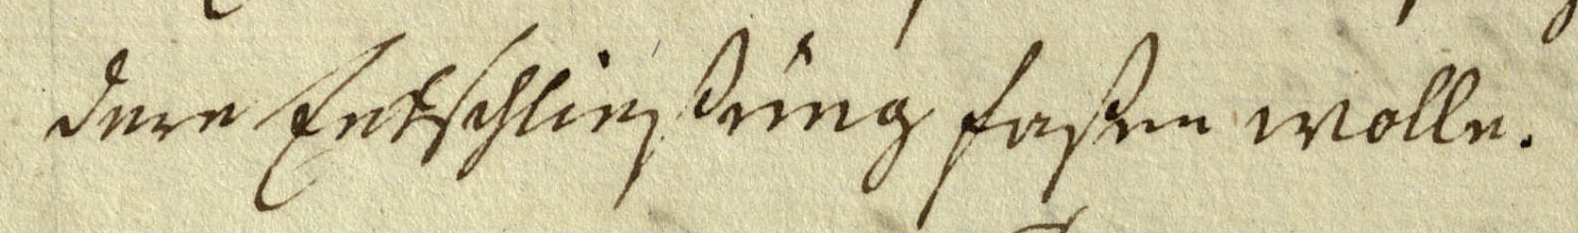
dere Entschließung faßen wolle.
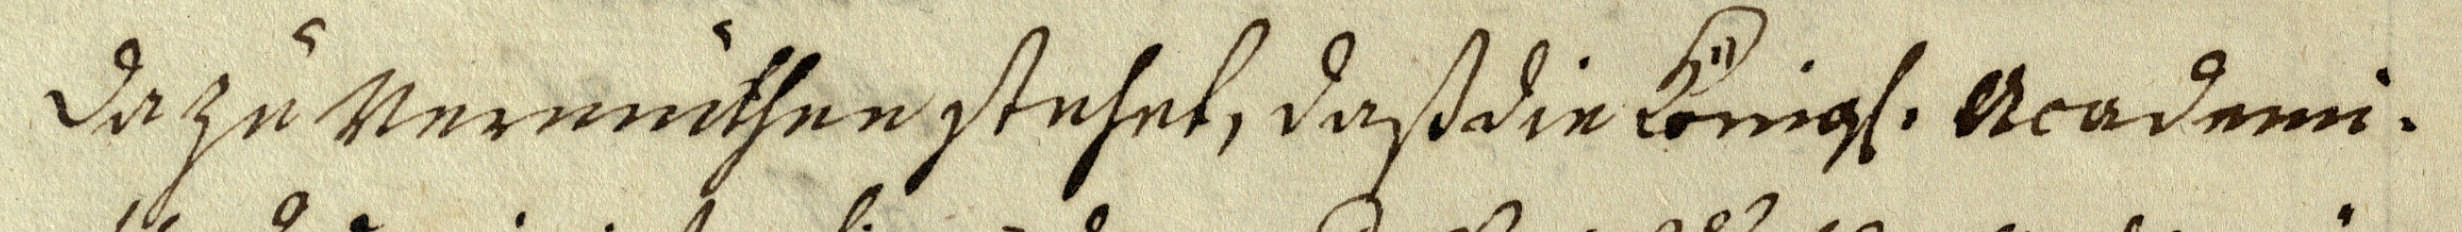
da zu vermuthen stehet, daß die Königl: academi¬
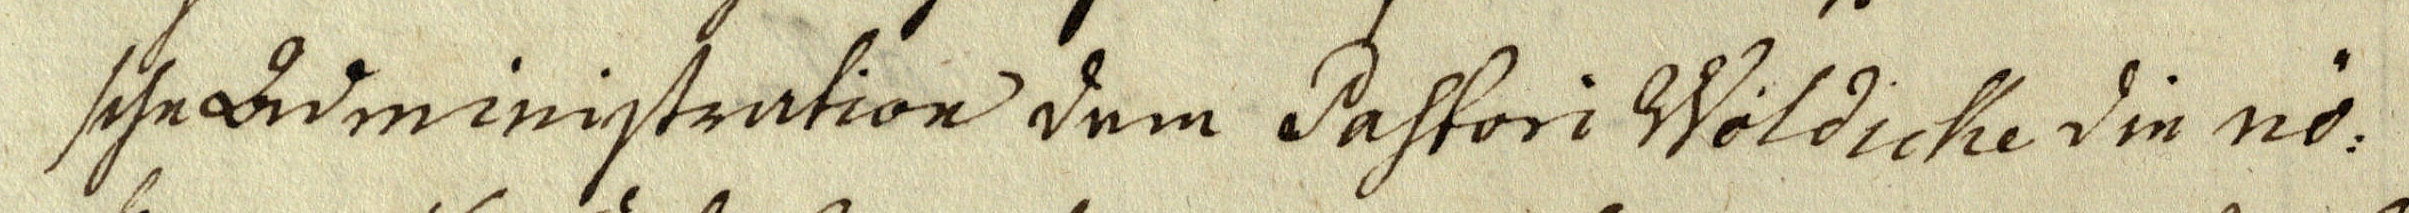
sche Administration dem Pastori Wöldicke die nö¬
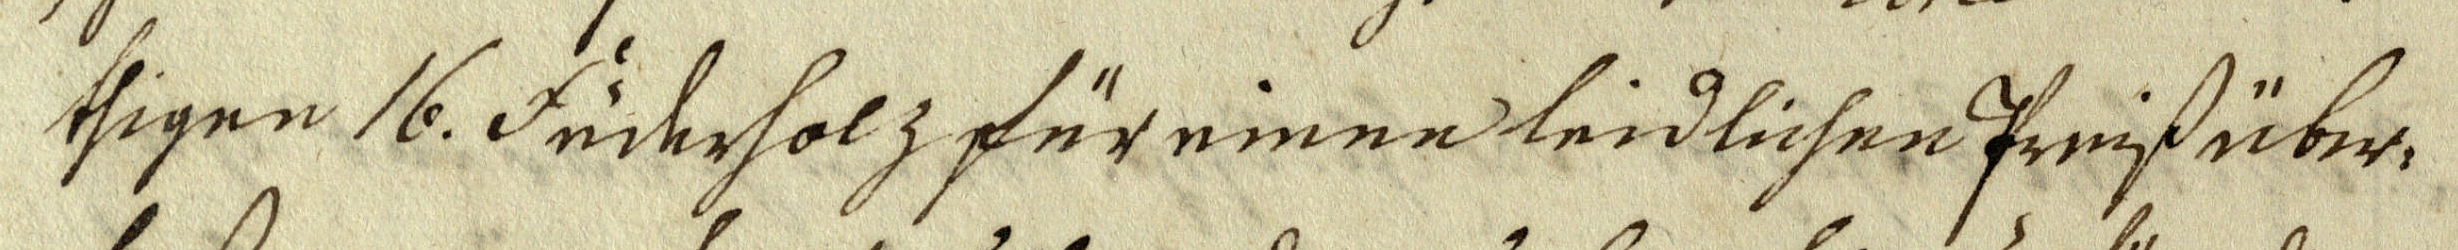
thigen 16. Fuderholz für einen leidlichen Preiß über¬
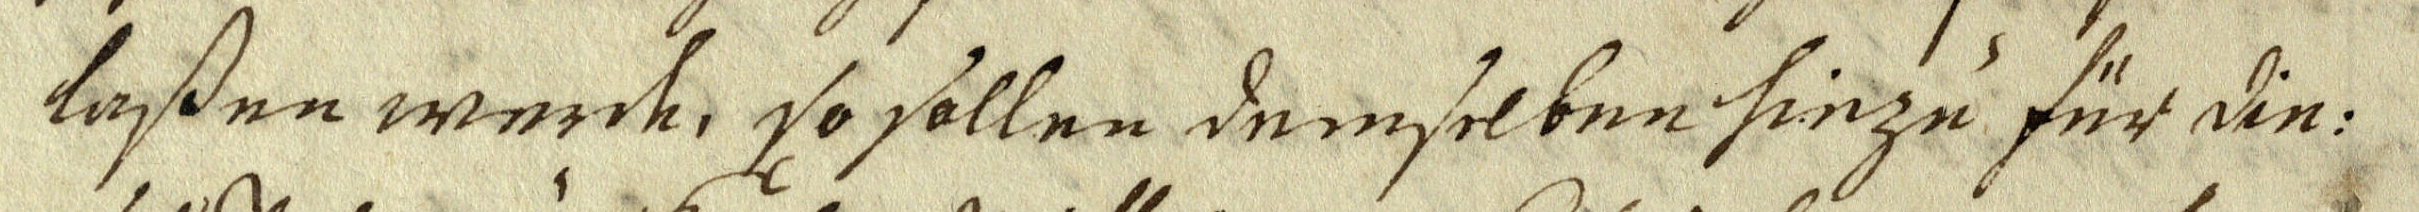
laßen werde, so sollen demselben hiezu für die¬
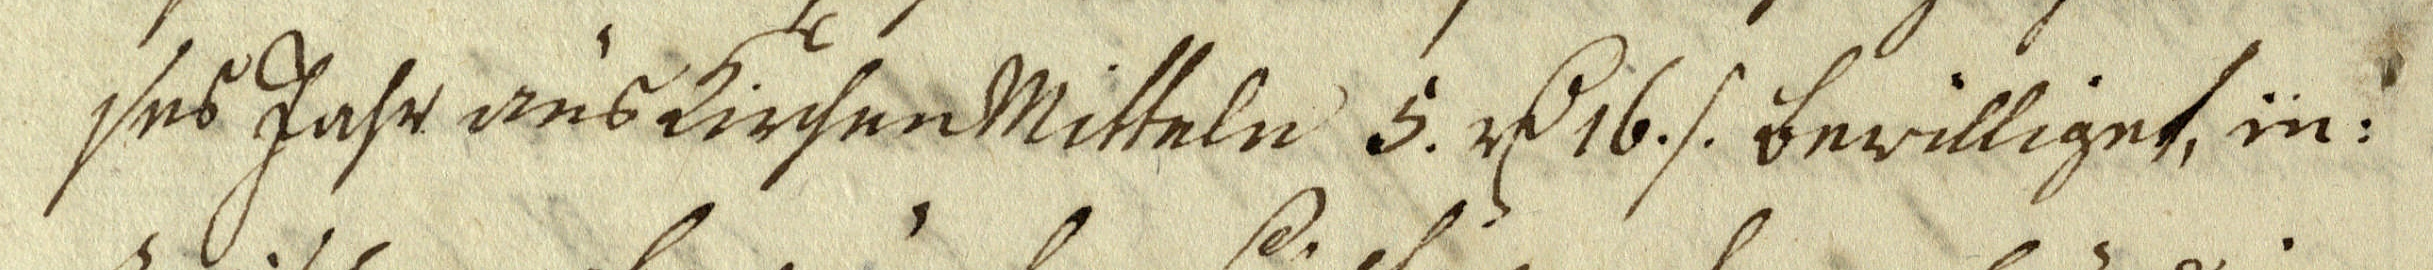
ses Jahr aus Kirchen Mitteln 5. r 16.s. bewilliget, in¬
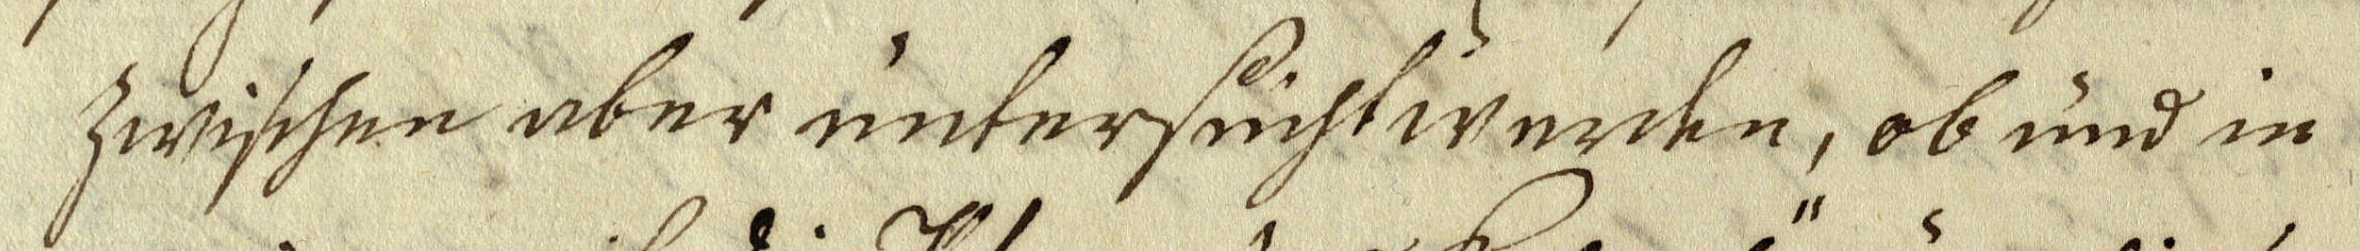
zwischen aber untersucht werden, ob und in
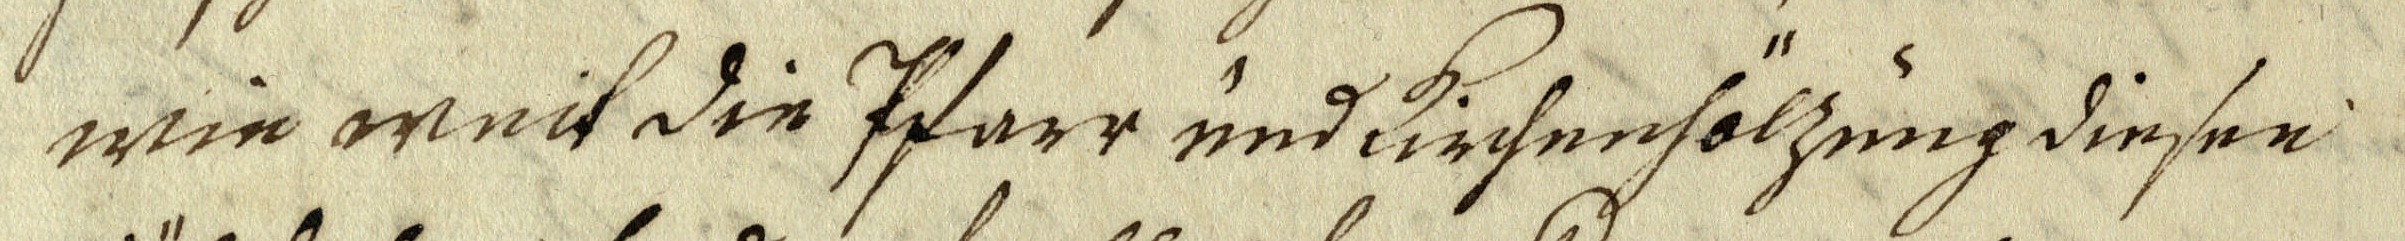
wie weit die Pfarr und Kirchenhölzung diesen
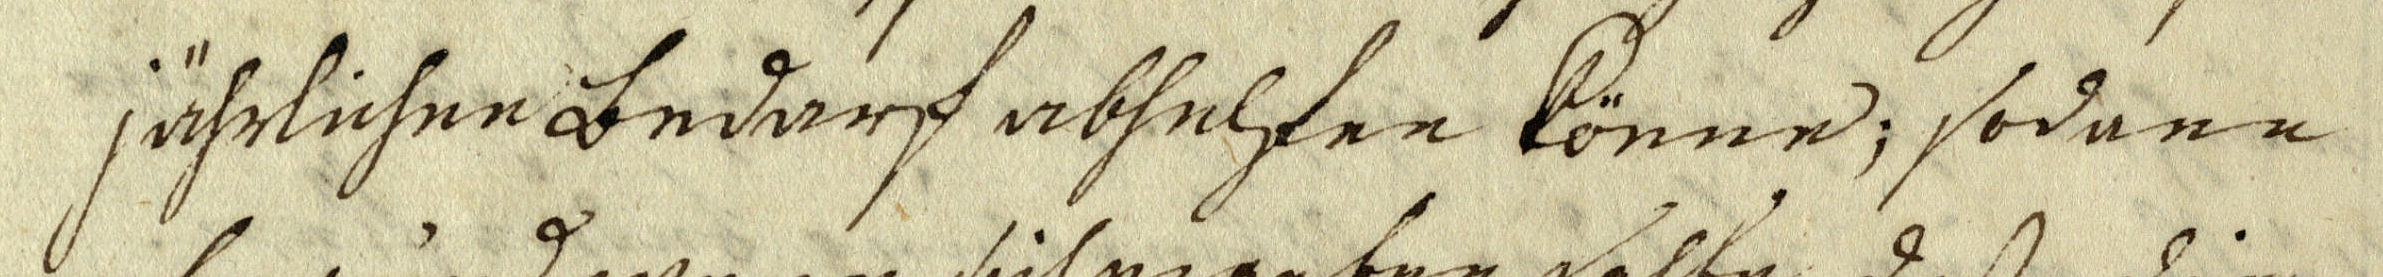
jährlichen Bedarf abhelfen könne; sodann
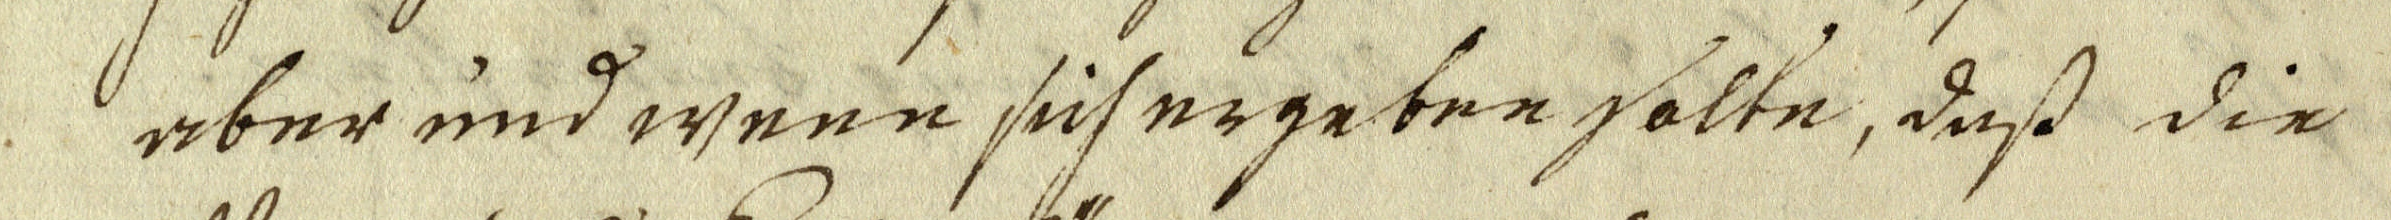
aber und wenn sich ergeben solte, daß die
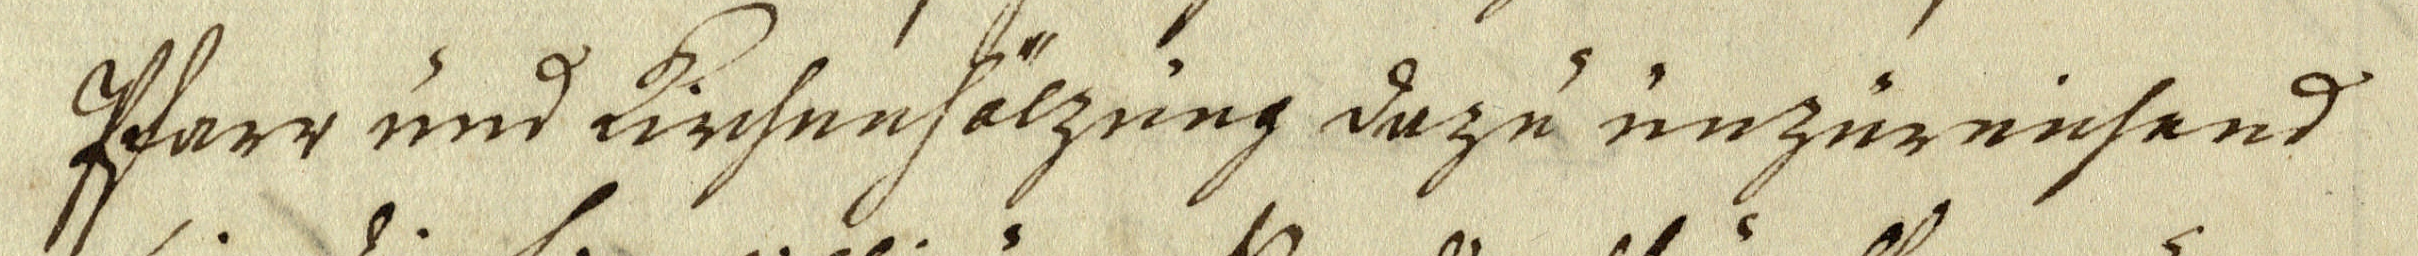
Pfarr und Kirchenhölzung dazu unzureichend
